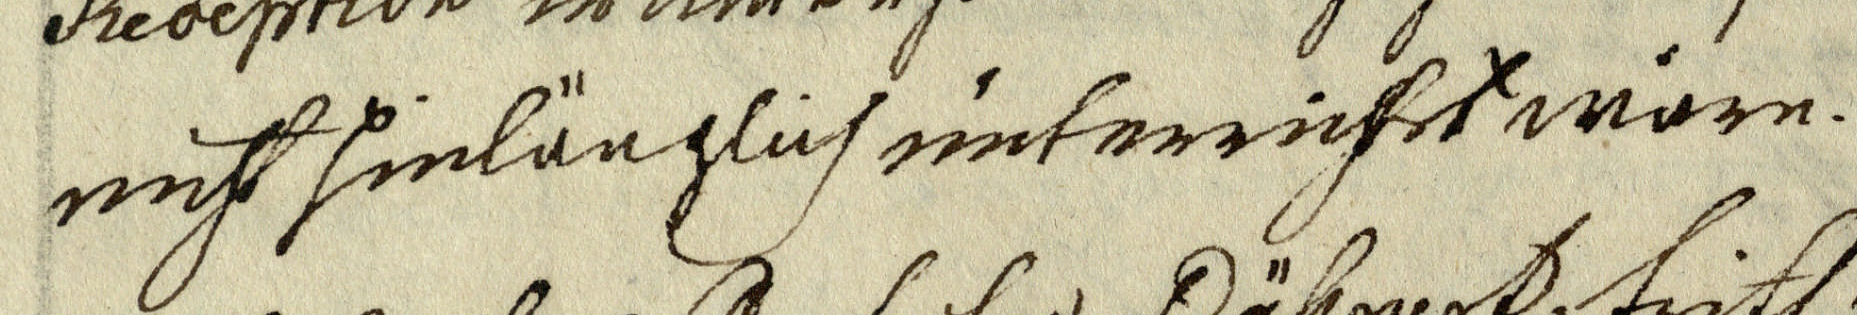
nicht hinlänglich unterrichtet wäre.
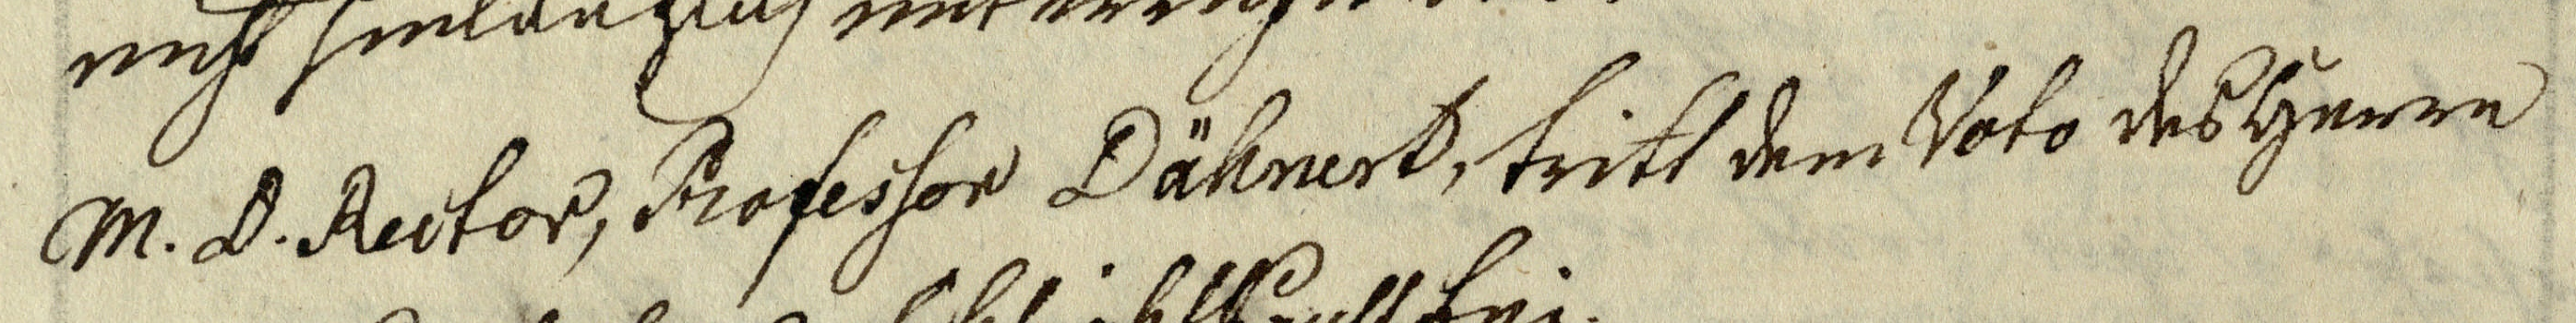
M. D. Rector Dähnert tritt dem Voto des Herrn
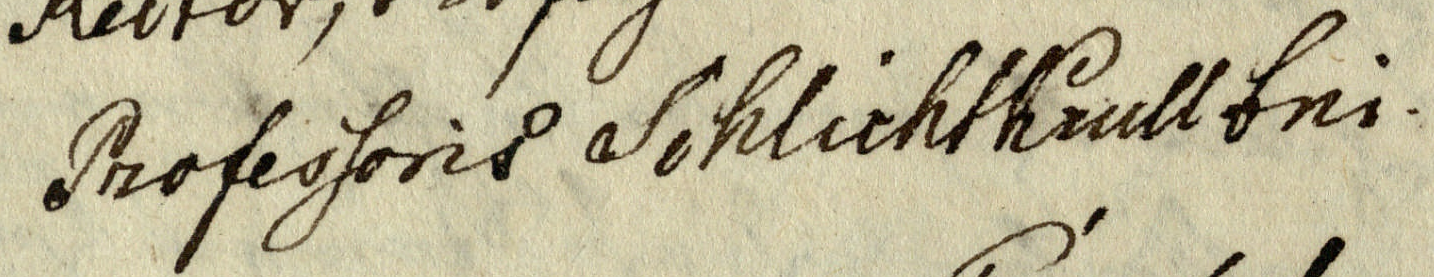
Professoris Schlichtkrull bei.
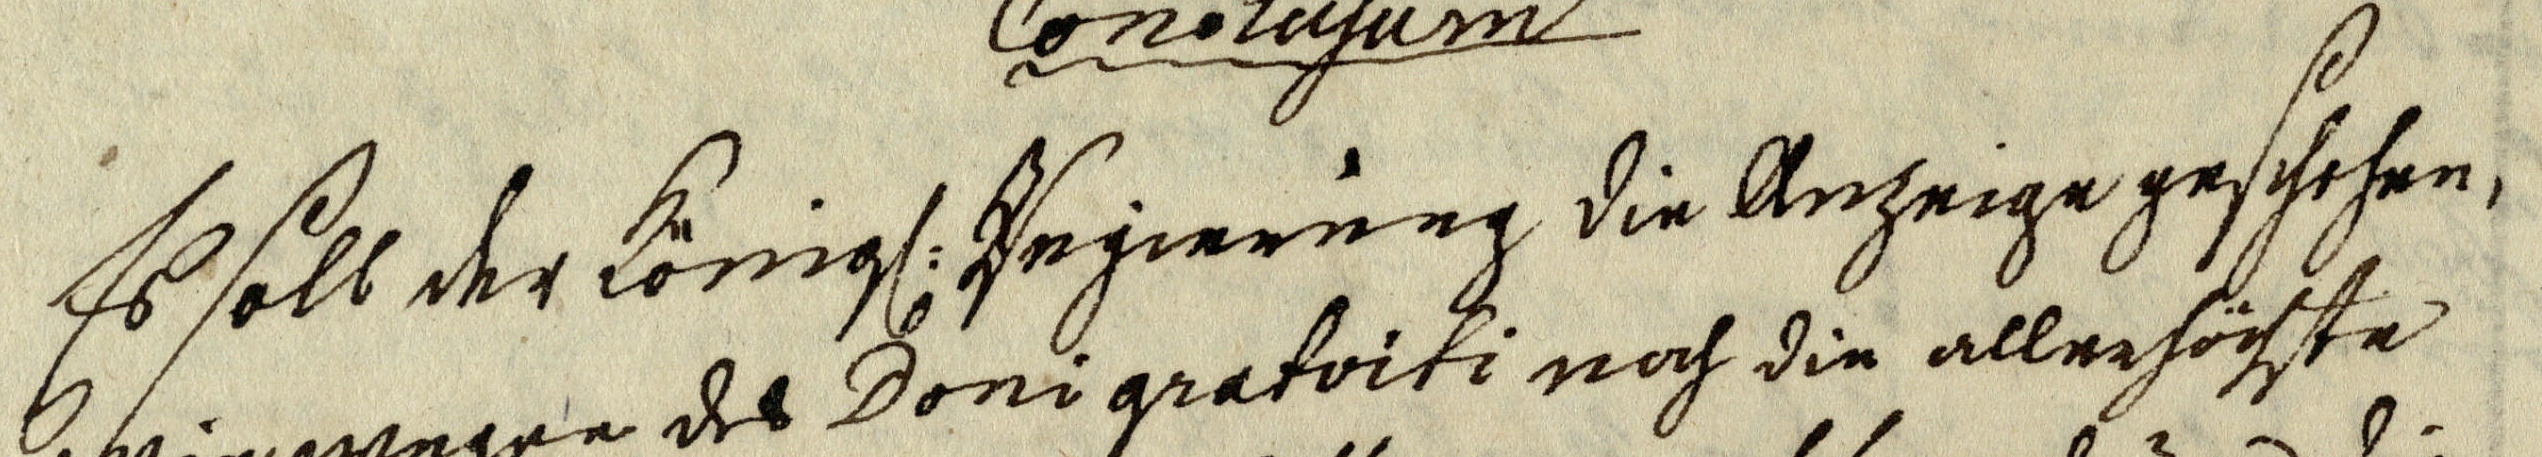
Es soll der Königl. Regierung die Anzeige geschehen,
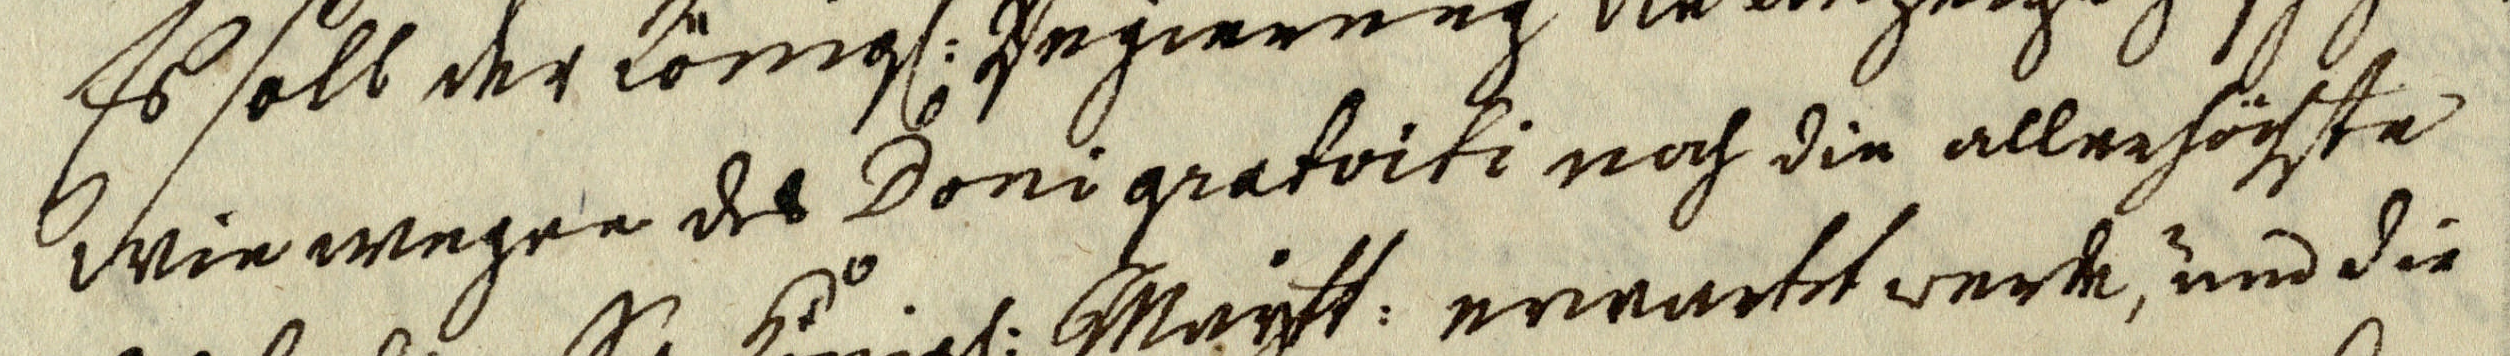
wie wegen des Doni gratuiti noch die allerhöchste
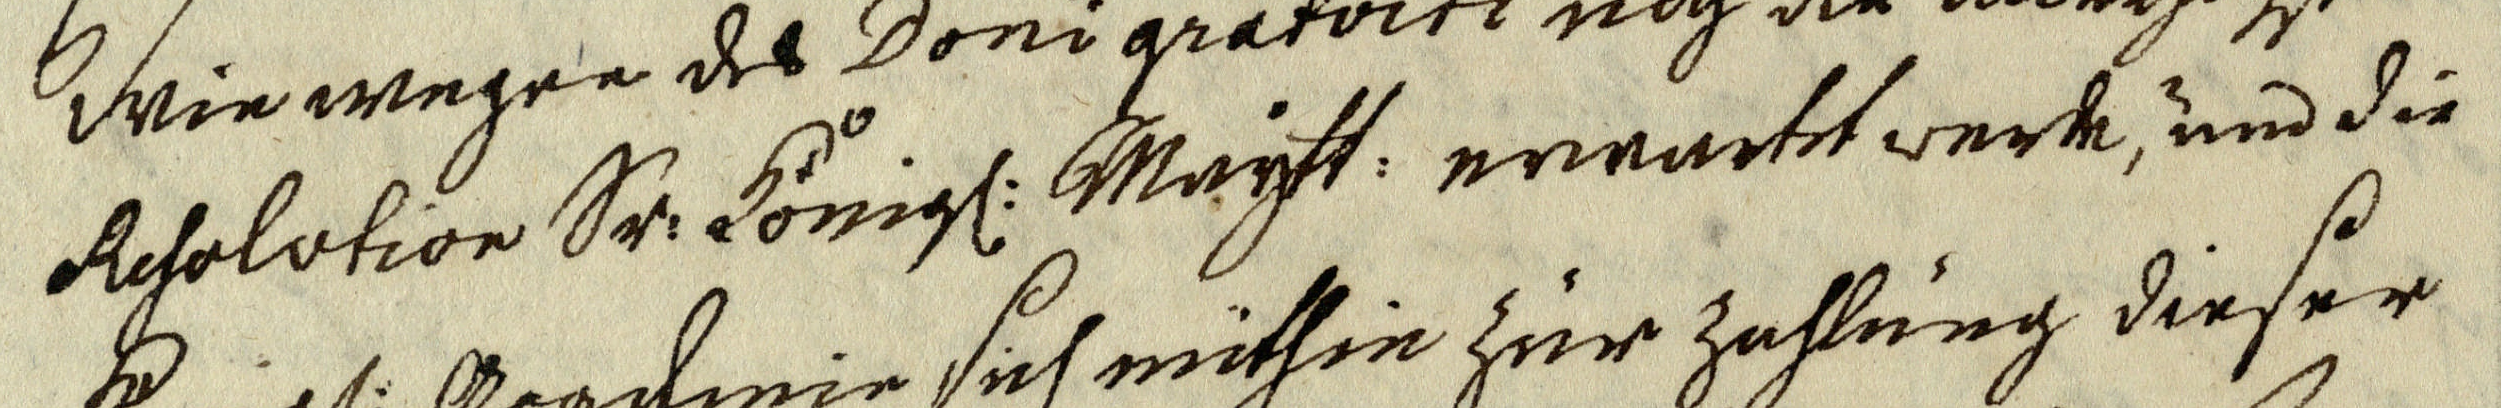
Resolution Sr Königl. Maÿtt. erwartet werde, und die
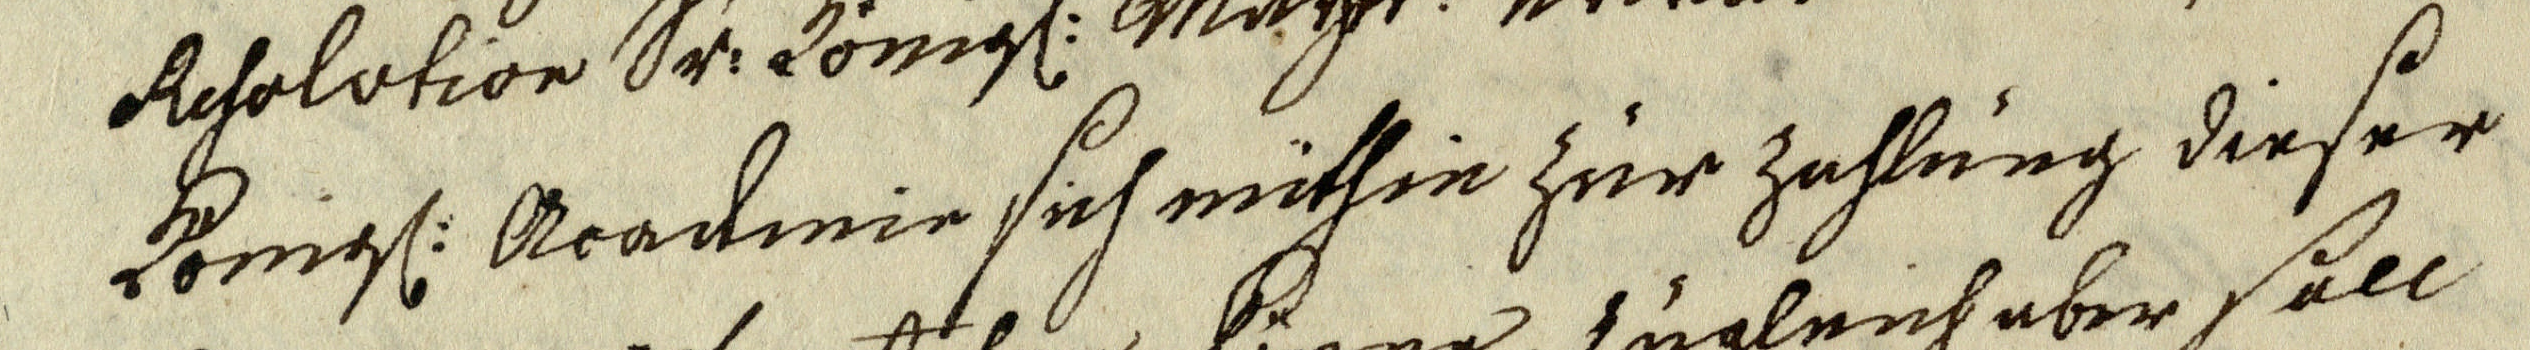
Königl. Academie sich mithin zur Zahlung dieser
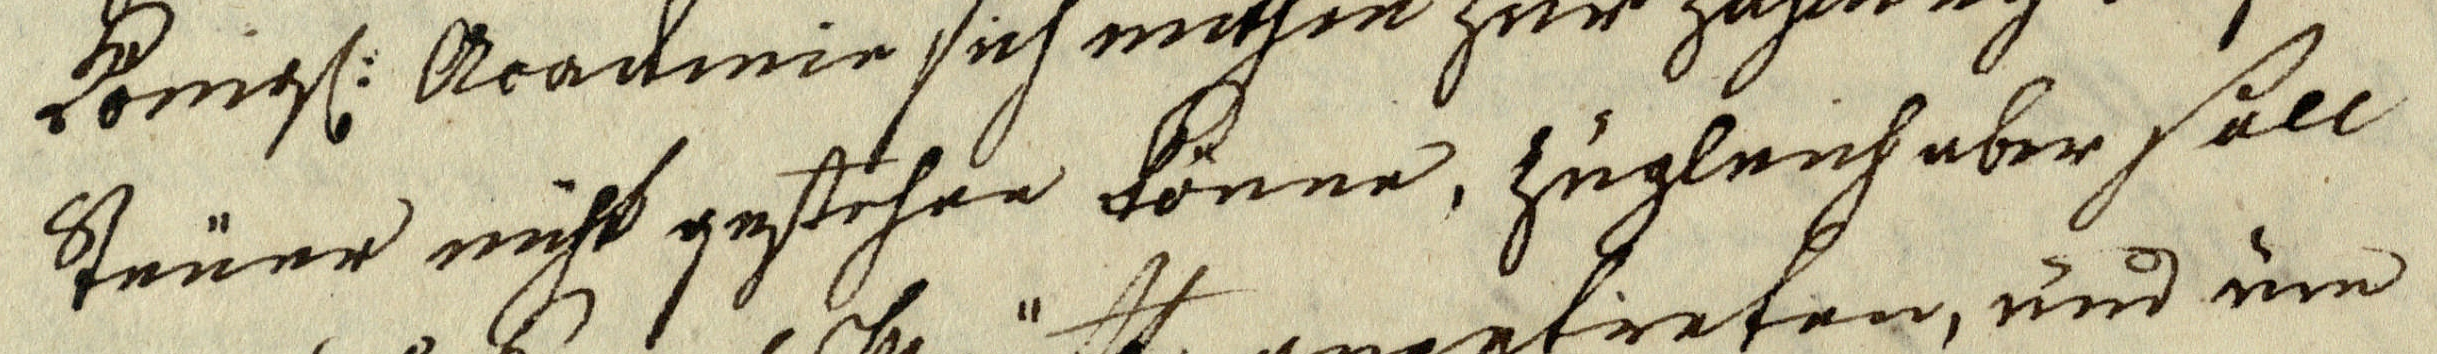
Steuer nicht gestehen könne, zugleich aber soll
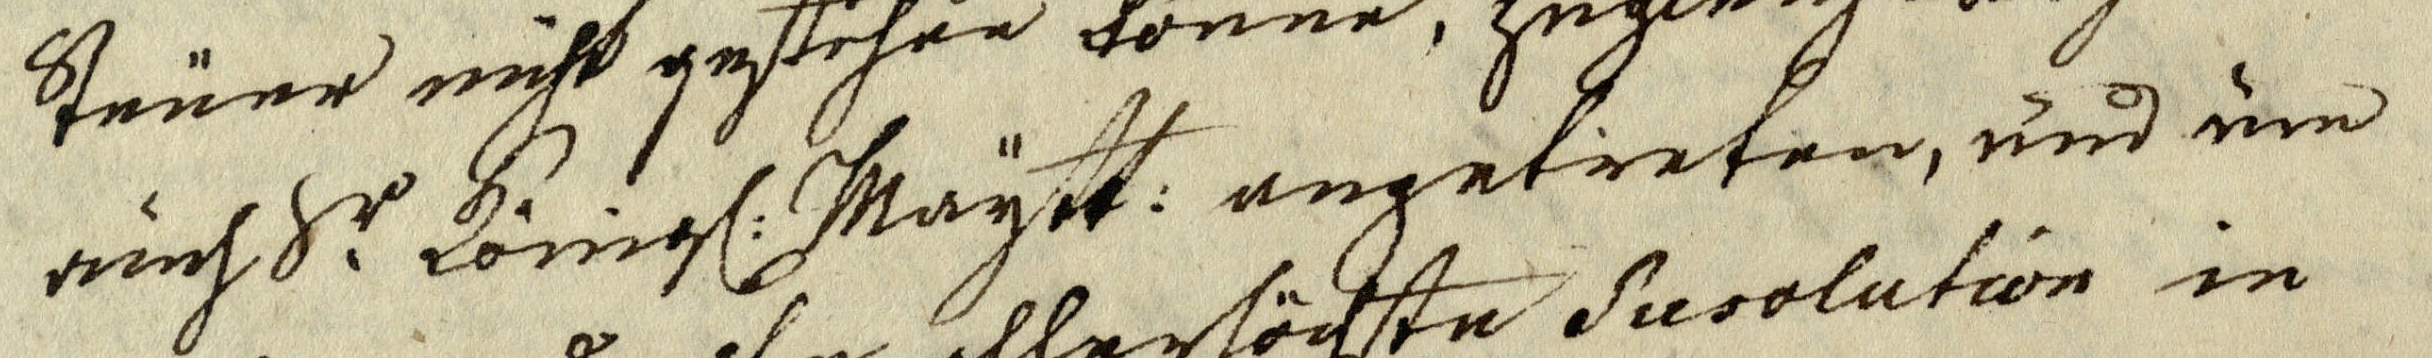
auch Sr Königl. Maÿtt. angetreten, und um
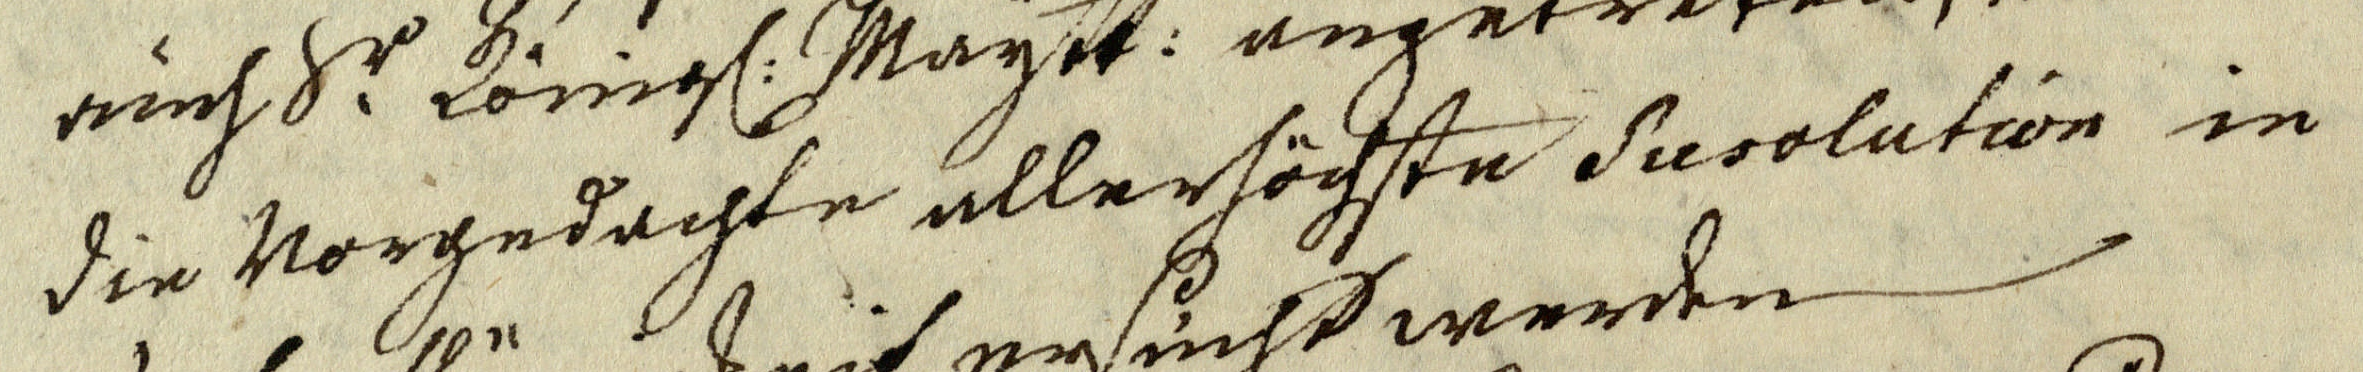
die vorgedachte allerhöchste Resolution in
